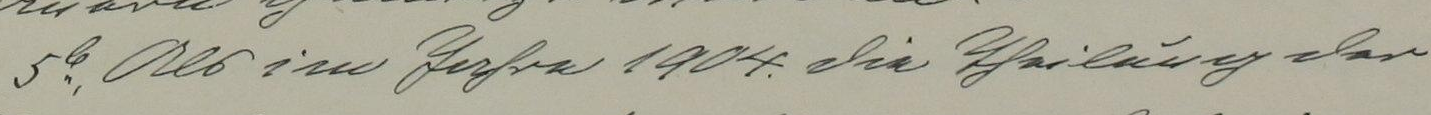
5b. Als im Jahre 1904. die Theilung der
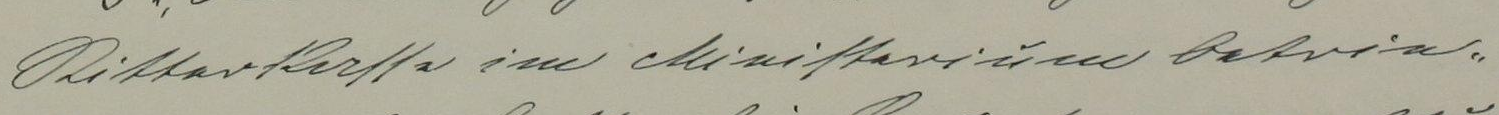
Ritterkasse im Ministerium betrie-
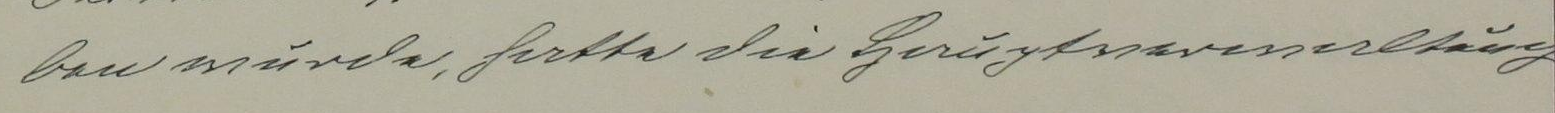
ben wurde, hatte die Hauptverwaltung
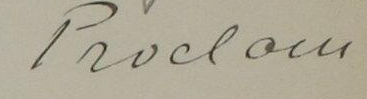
Proclam
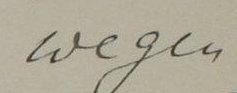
wegen
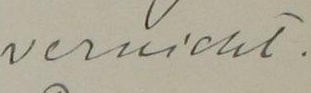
vernicht.
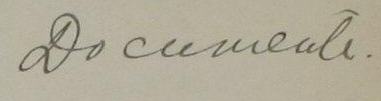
Documente
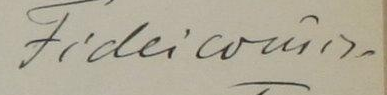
Fideicommis-
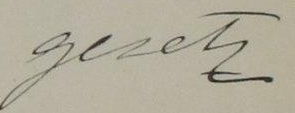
gesetz
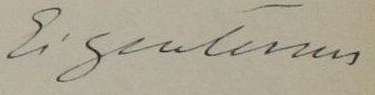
Eigentums
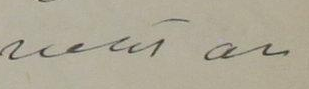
ercht an
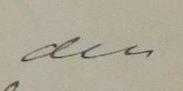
den
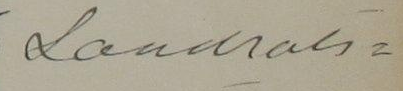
Landrats-
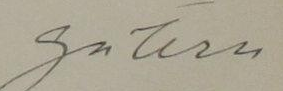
gütern
